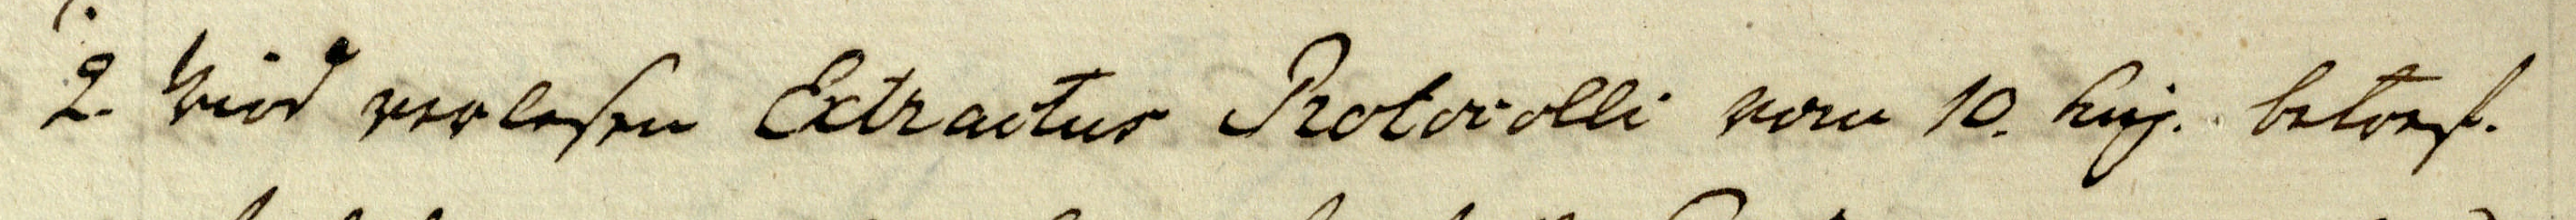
2. Wird verlesen Extractus Protocolli vom 10. huj. betref¬
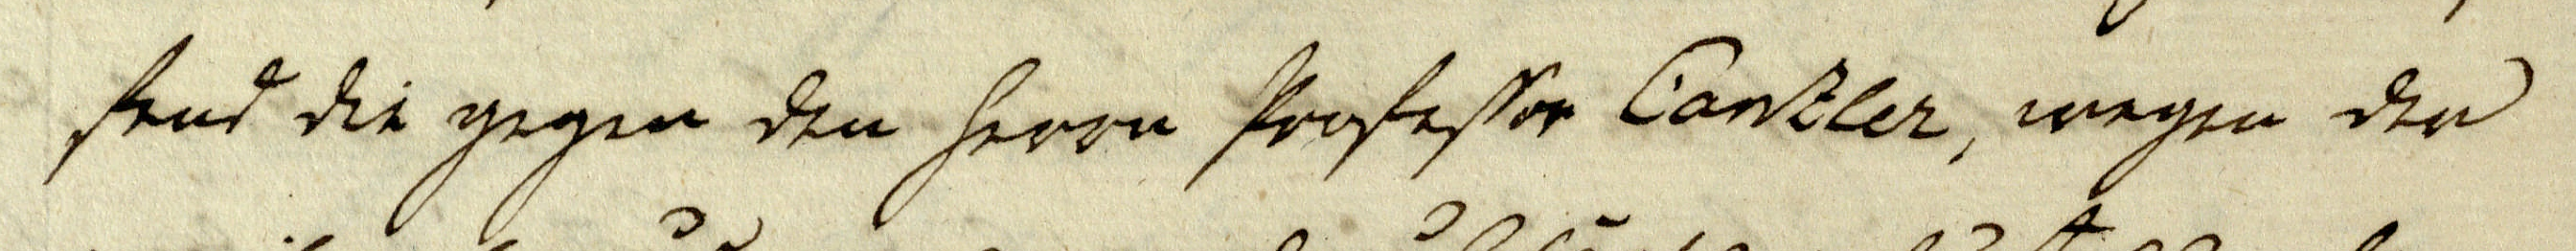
fend die gegen den Herrn Professor Canzler, wegen der
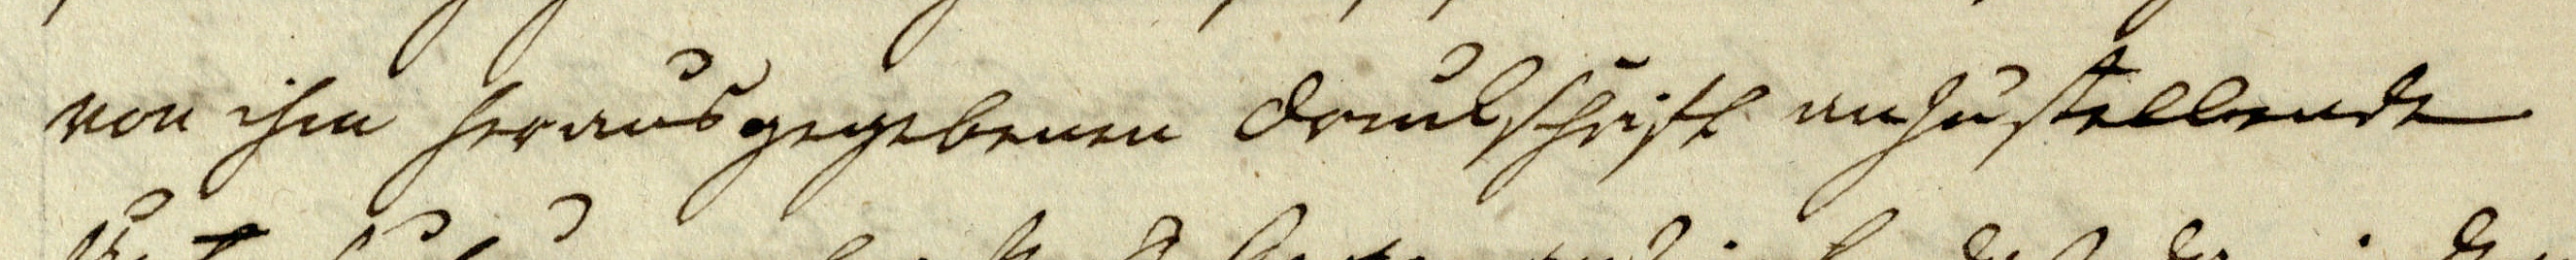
von ihm herausgegebenen Druckschrift anzustellende
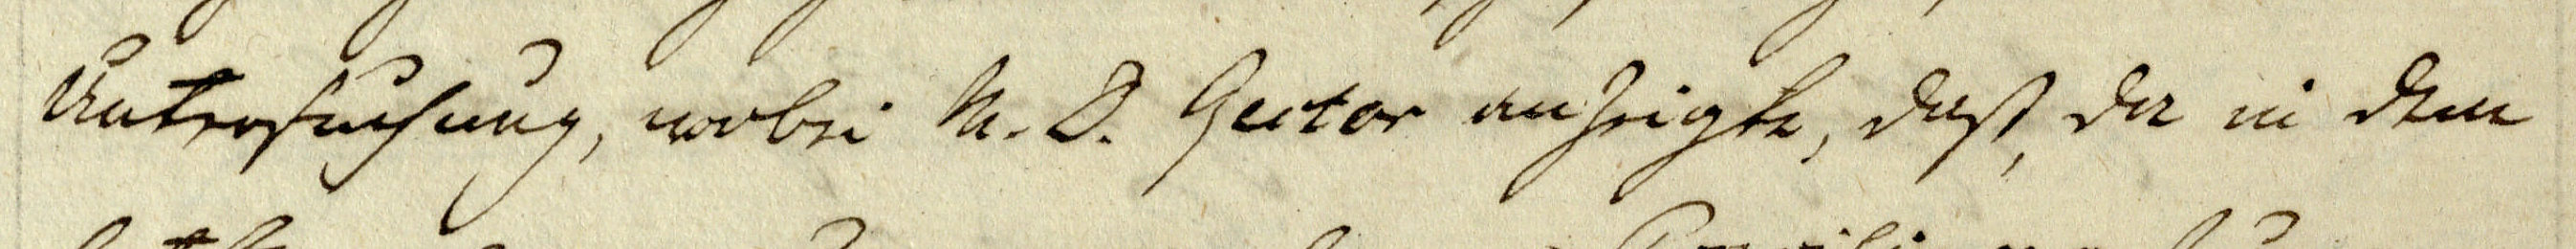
Untersuchung, wobei M. D. Rector anzeigte, daß, da in dem
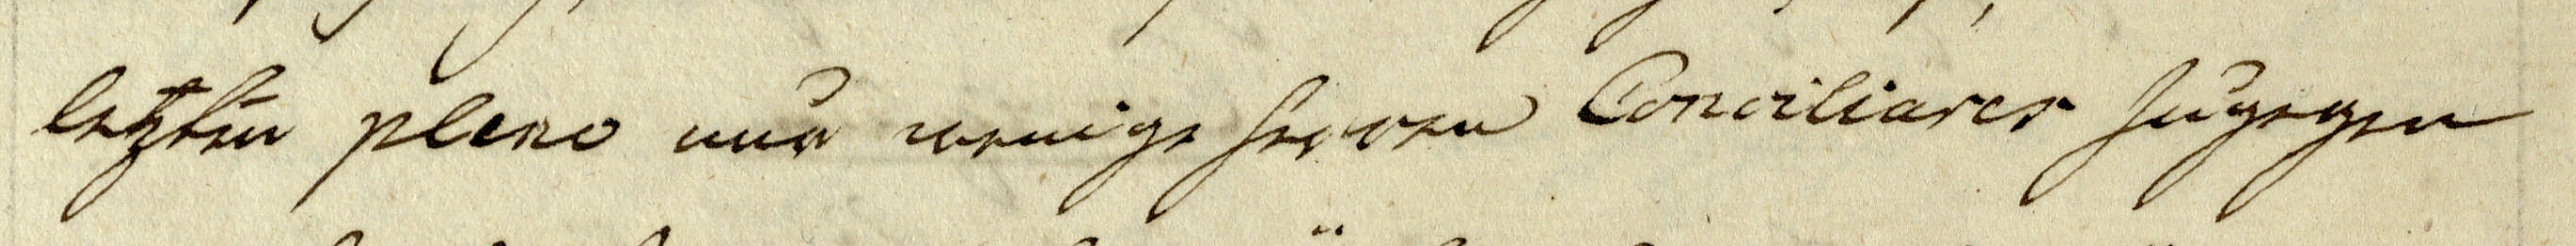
letzten pleno nur wenige Herren Conciliares zugegen
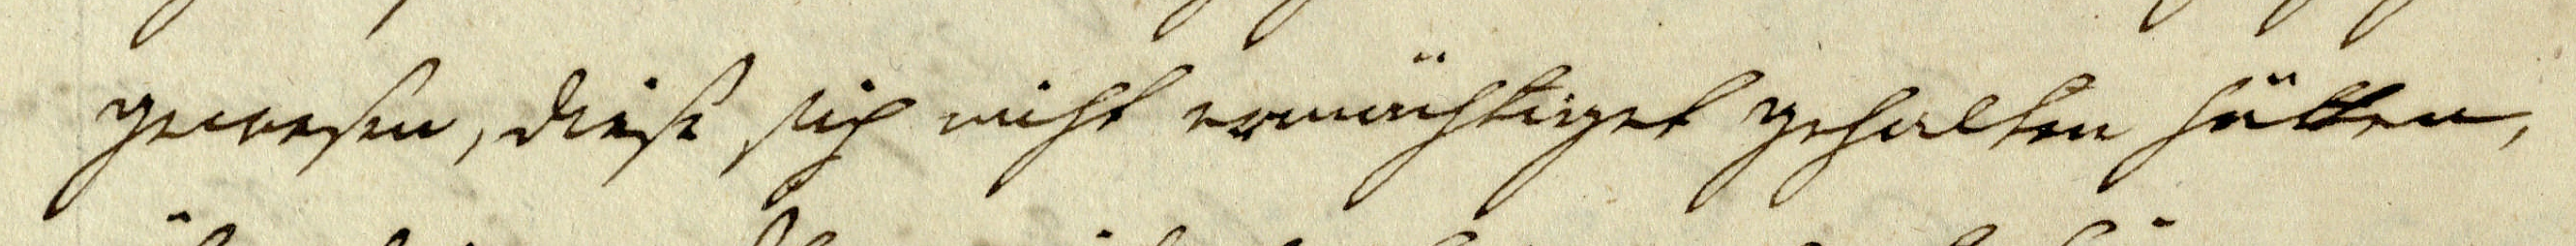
gewesen, diese sich nicht ermächtiget gehalten hätten,
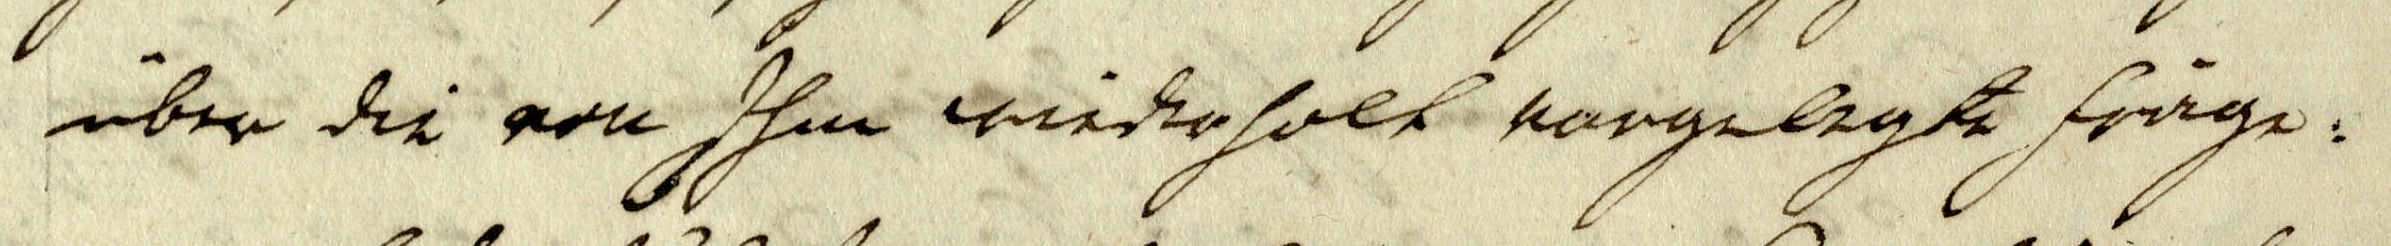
über die von Ihm wiederholt vorgelegte Frage:
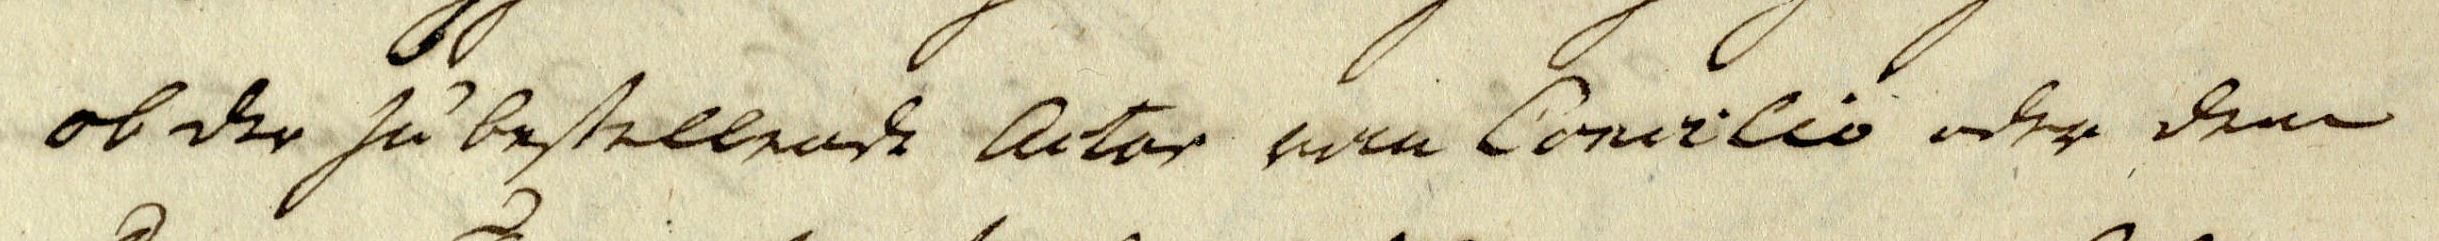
ob der zu bestellende Actor vom Concilio oder dem
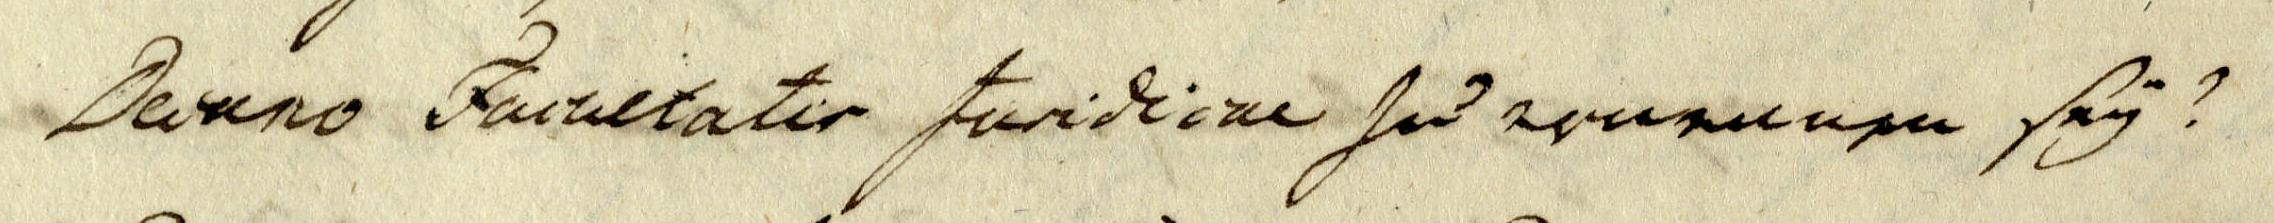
Decano Facultatis Juridicae zu ernennen seÿ?
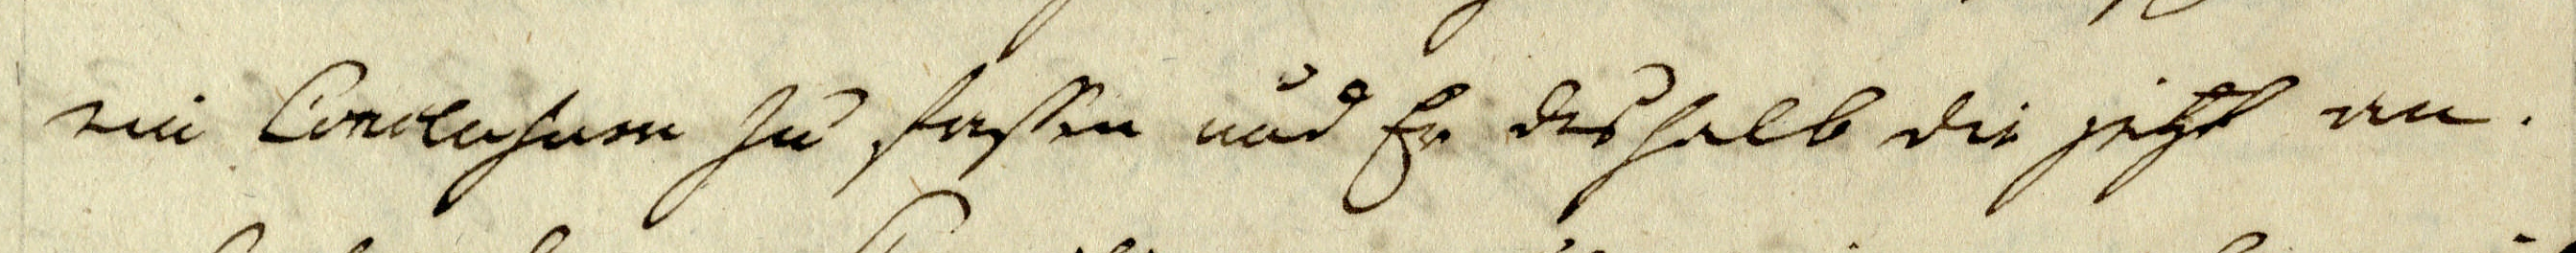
ein Conclusum zu fassen und Er deshalb die jetzt an¬
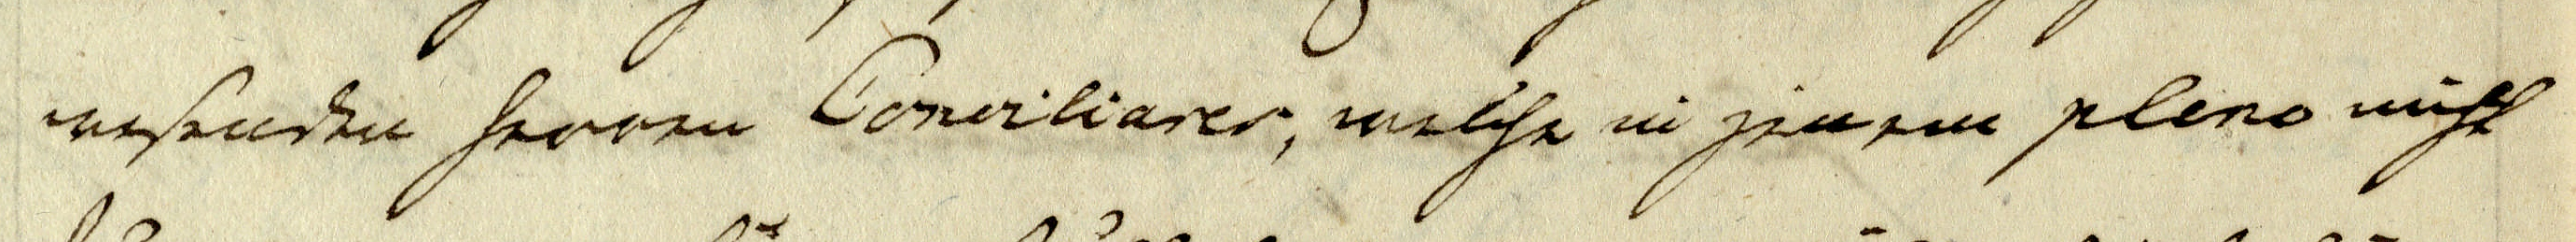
wesenden Herren Conciliares, welche in jenem pleno nicht
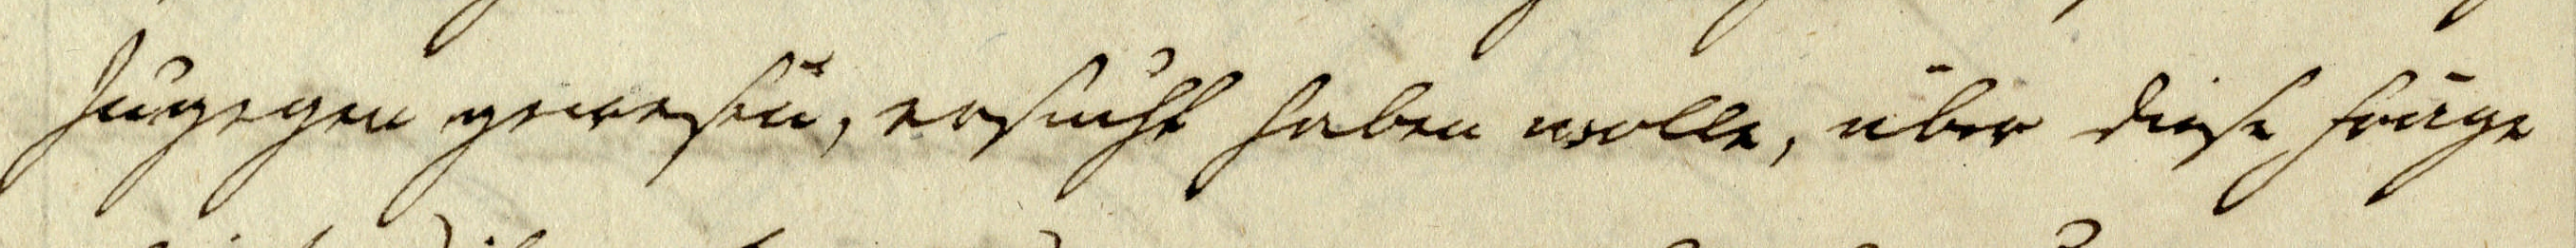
zugegen gewesen, ersucht haben wolle, über diese Frage
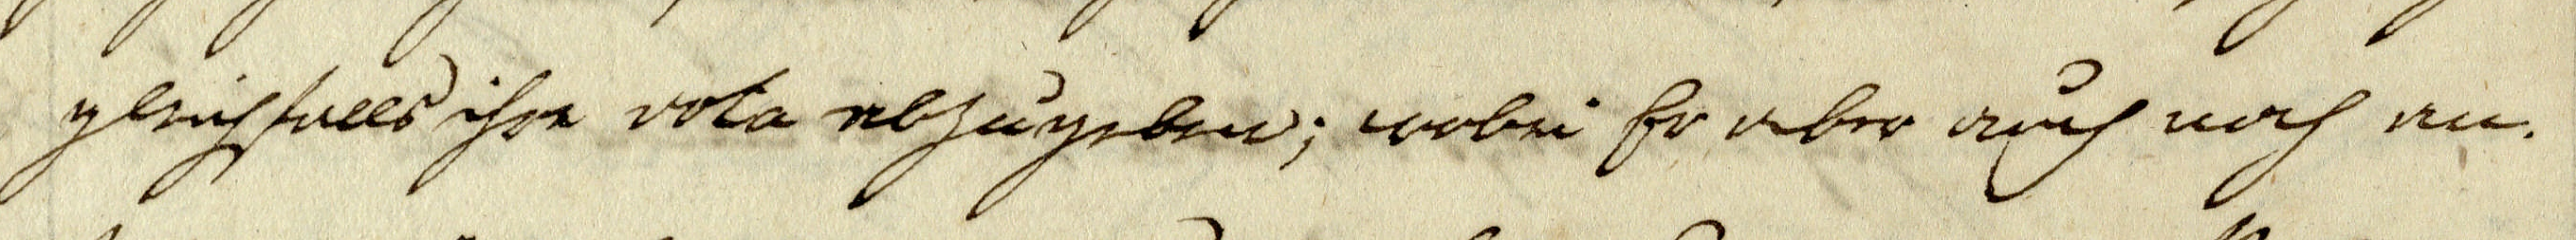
gleichfalls ihre vota abzugeben; wobei Er aber auch noch an¬
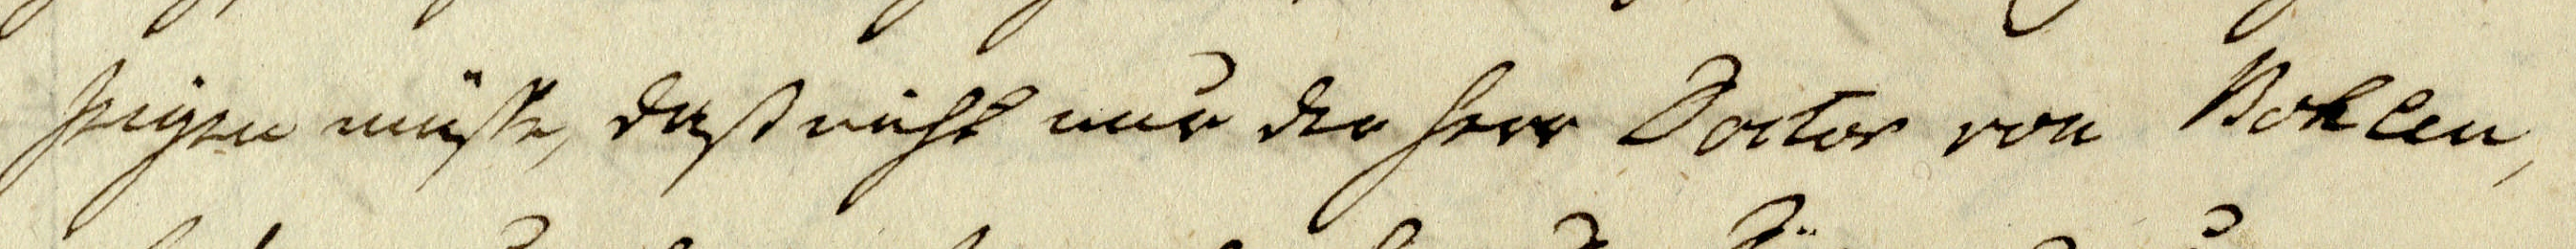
zeigen müsse, daß nicht nur der Herr Doctor von Bohlen
